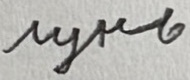лунь
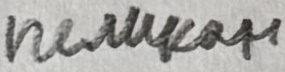пеликан
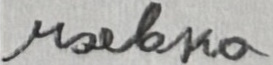мэевка
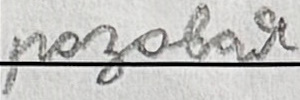розовая
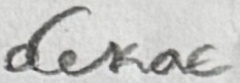бекас
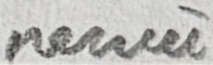пегий
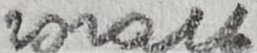гоголь
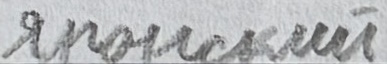японский
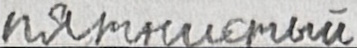пятнистый
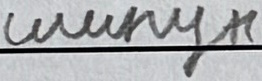шипун
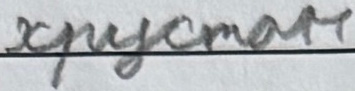хрустан
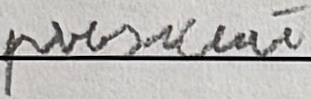рыжий
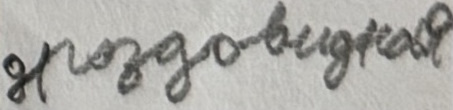дроздовидная
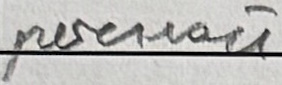речной
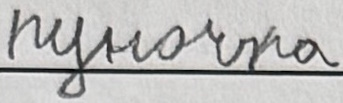пуночка
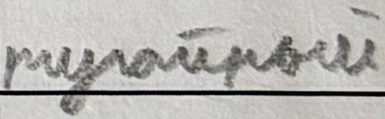тугайный
